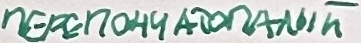перепончатопалый
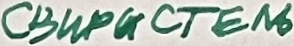свиристель
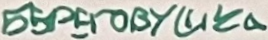береговушка
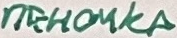пеночка
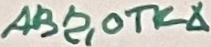авдотка
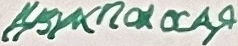двухполосая
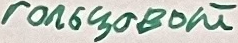гольцовый
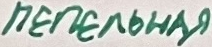пепельная
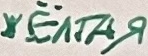жёлтая
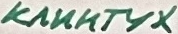клинтух
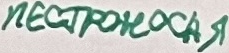пестроносая
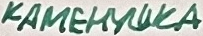каменушка
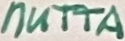питта
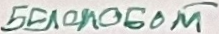белолобый
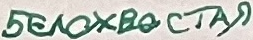белохвостая
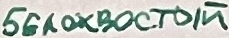белохвостый
